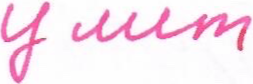улит
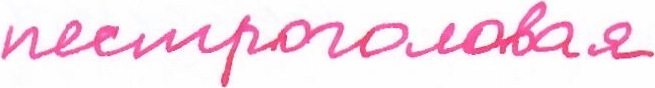пестроголовая
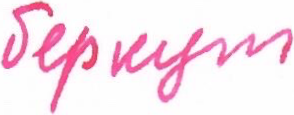беркут
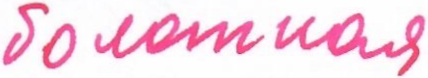болотная
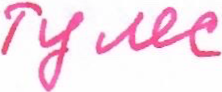тулес
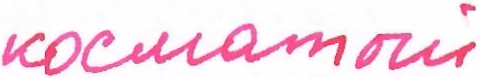косматый
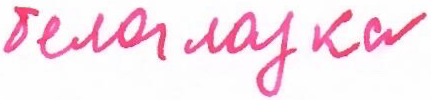белоглазка
